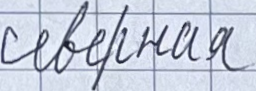северная
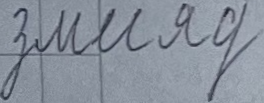змееяд
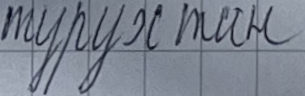турухтан
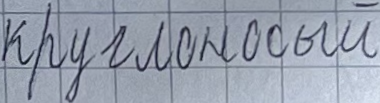круглоносый
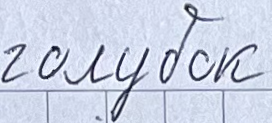голубок
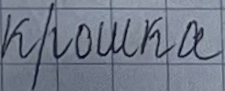крошка
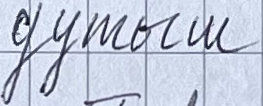дутыш
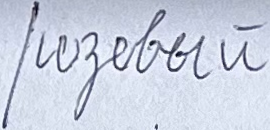розовый
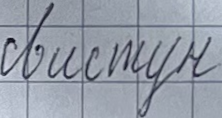свистун
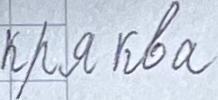кря ква
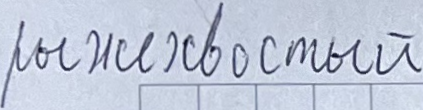рыжехвостый
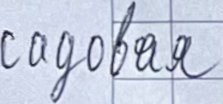садовая
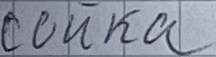сойка
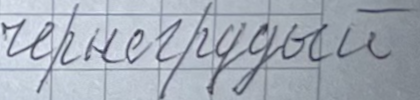черногрудый
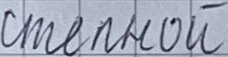степной
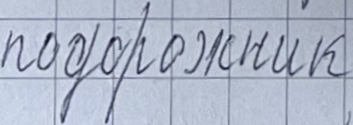подорожник
